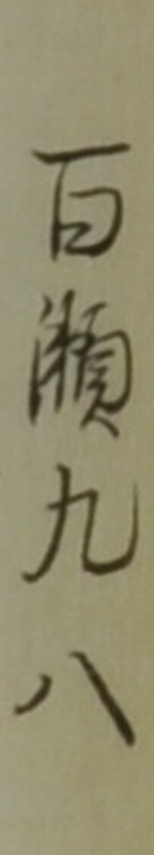百瀬九八
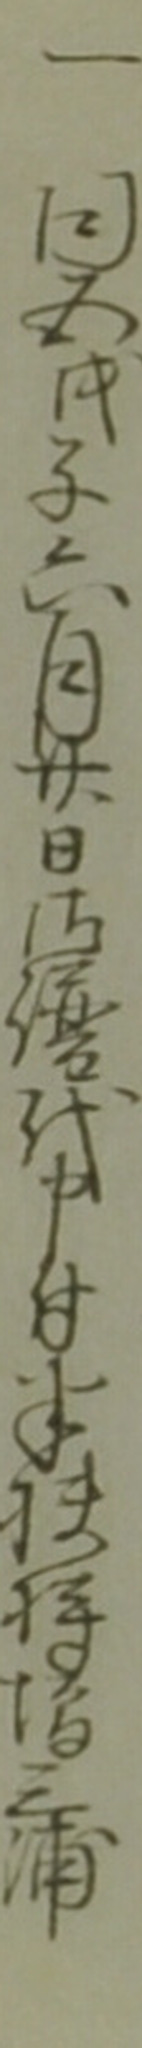一同五戊子六月廿日御譜代申付半扶持増三浦
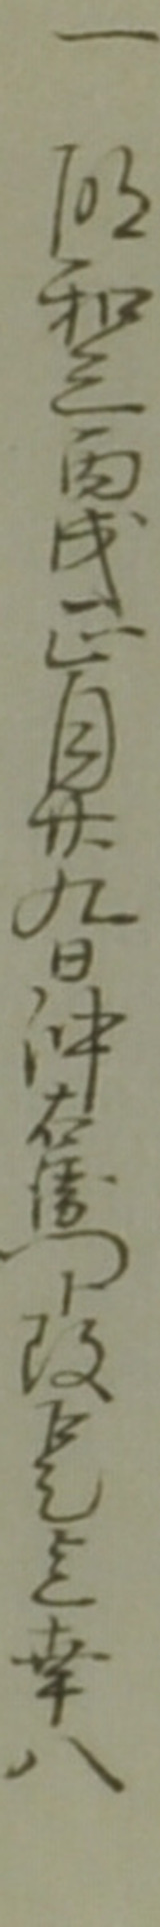一明和三丙戌正月廿九日沖右衛門ト改是迄幸八
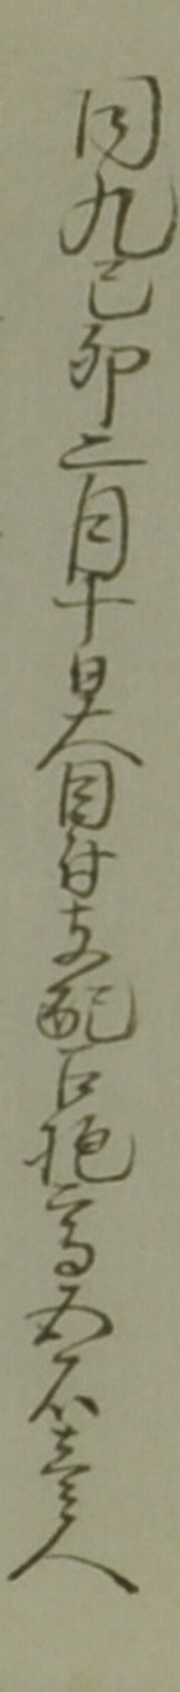一同九己卯二月十日大目付支配召抱高五石壱人
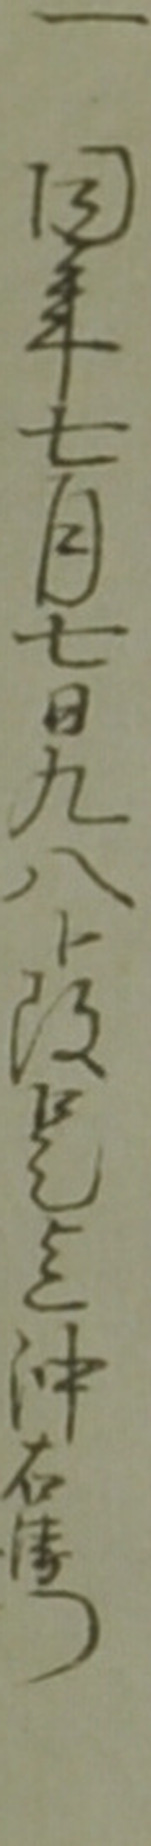一同年七月七日九八ト改是迄沖右衛門
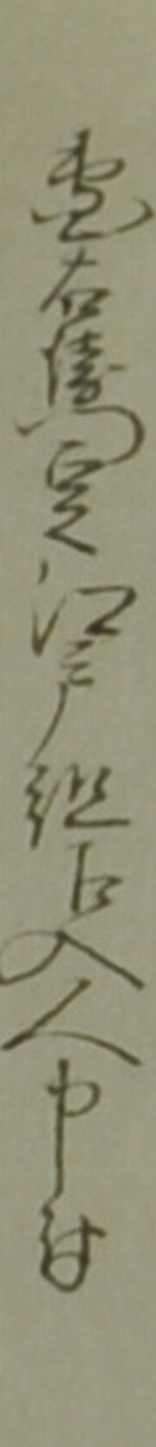団右衛門定江戸組江入人申付
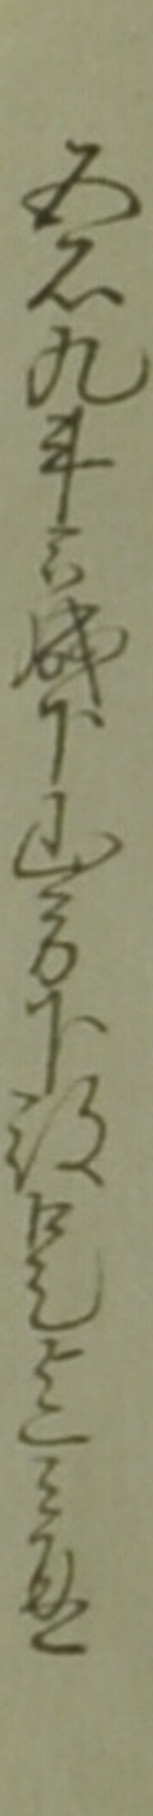五石九斗被成下山方下役是迄之通
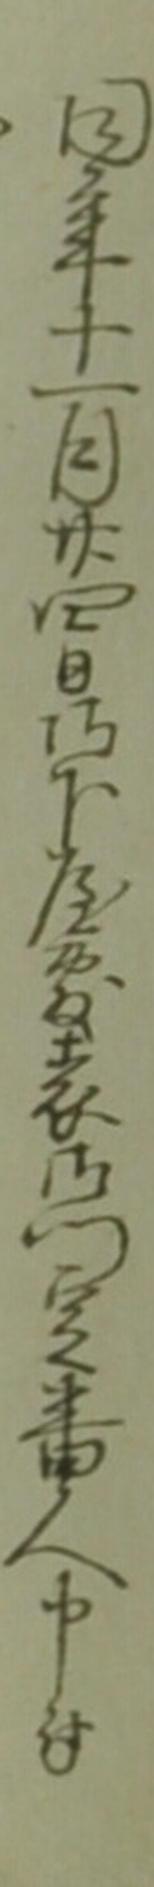一同年十一月廿四日御下屋敷表御門定番人申付

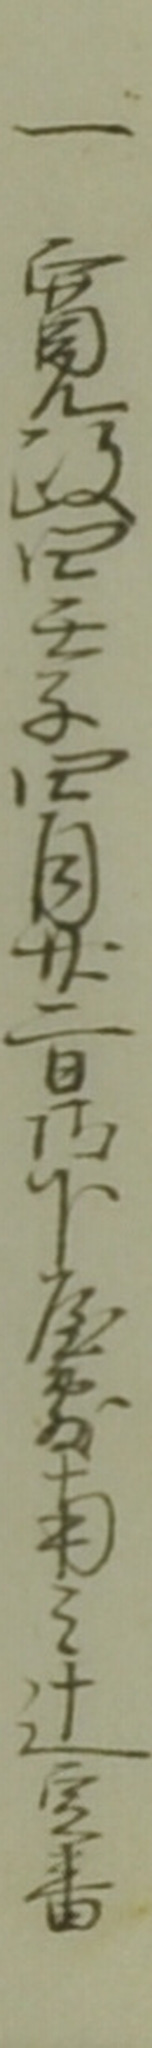一寛政四壬子四月廿二日御下屋敷南之辻定番
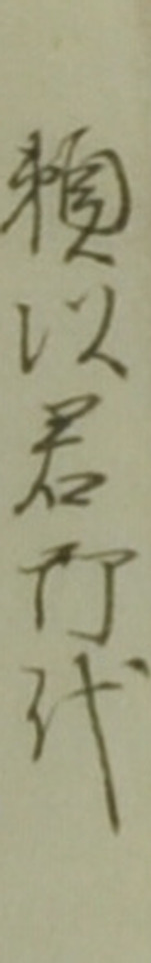頼以君御代
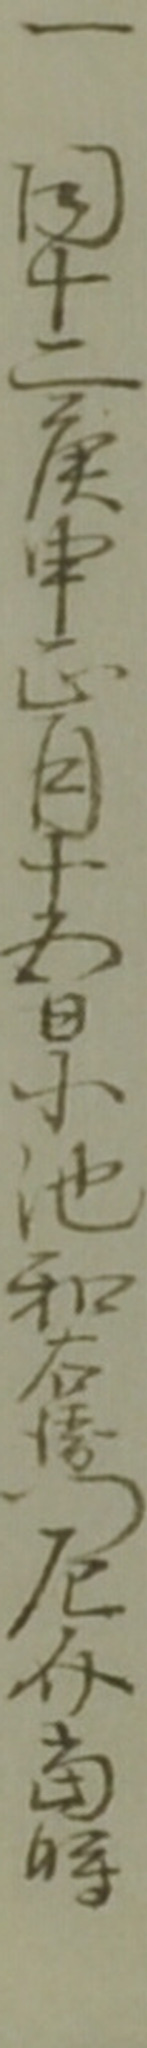一同十二庚申正月十五日小池和右衛門厄介当時
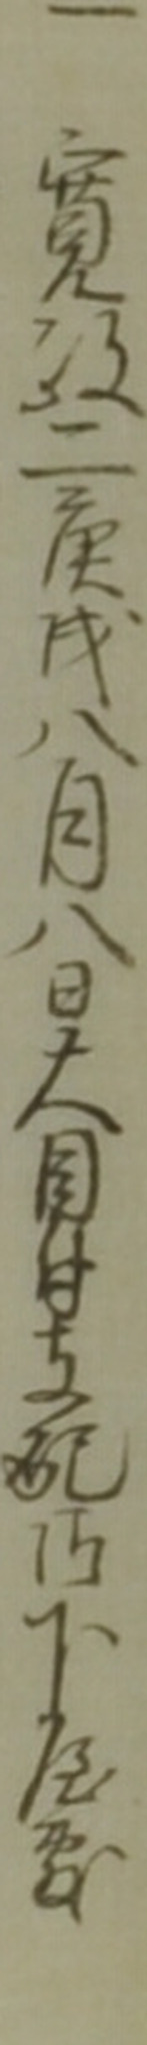一寛政二庚戌八月八日大目付支配御下屋敷
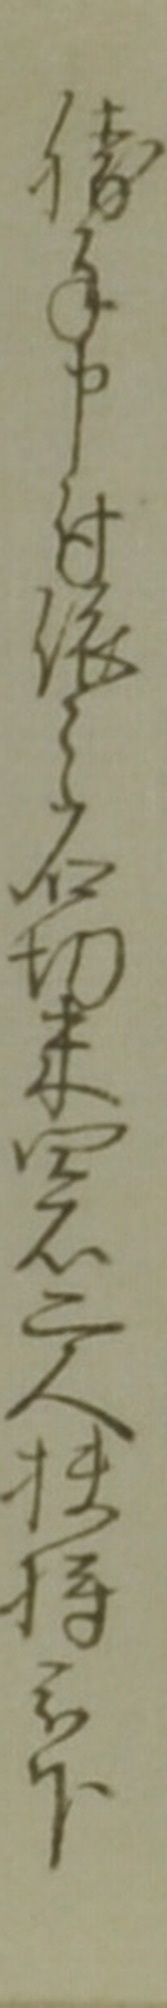勝手申付依之石切米四石二人扶持被下
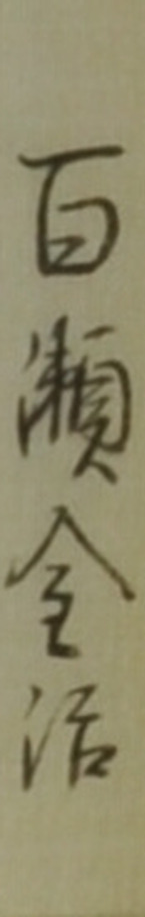百瀬金治
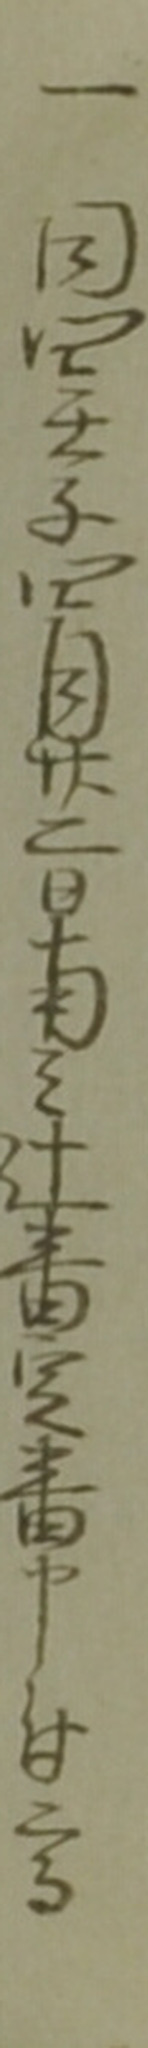一同四壬子四月廿二日南之辻番定番申付高
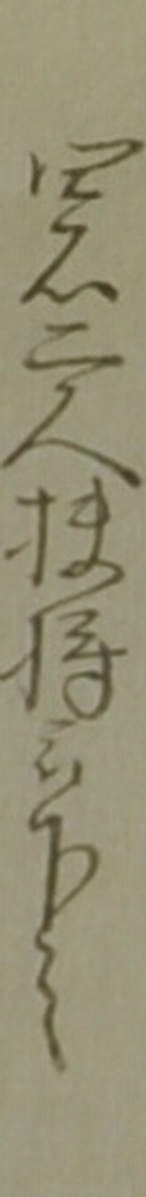四石二人扶持被下之
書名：無足諸士勤仕録（九）
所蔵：伊那市立高遠町図書館・合同会社AMANE
